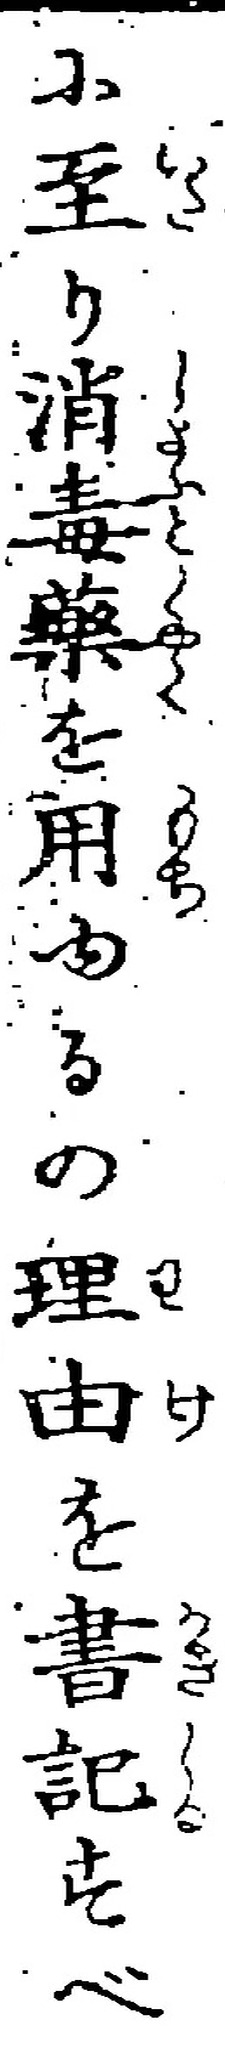に至り消毒薬を用ゆるの理由を書記すべ
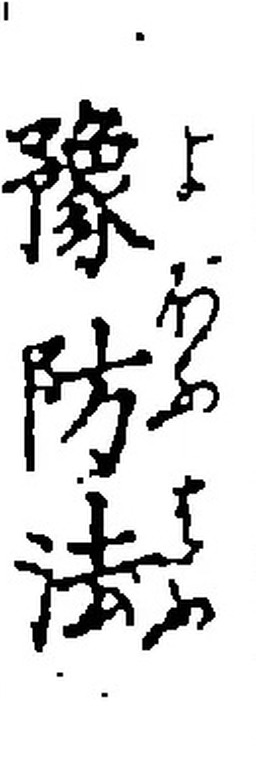予防法
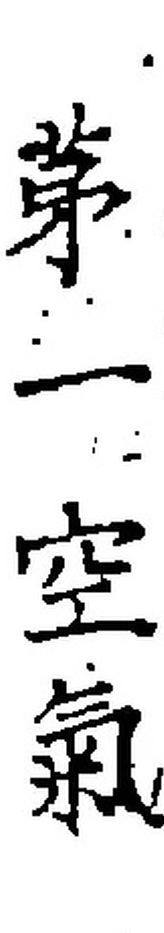第一空気
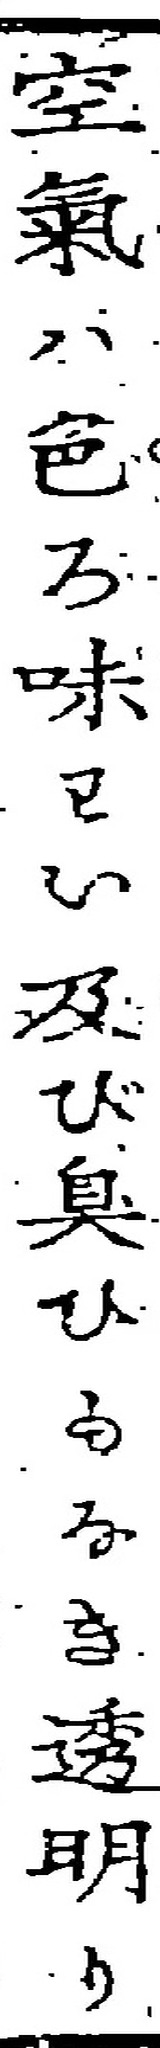空気は色ろ味わい及び臭ひもなき透明り
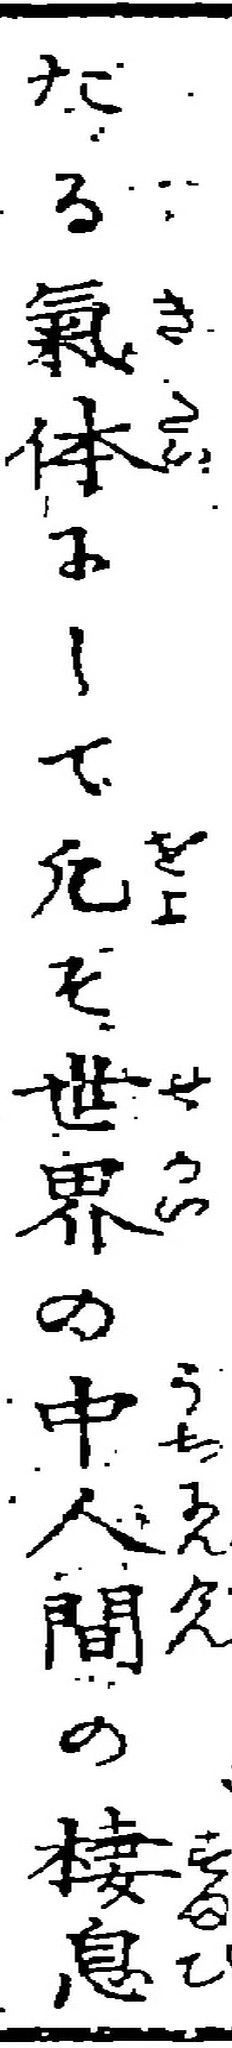たる気体にして凡を世界の中人間の棲息
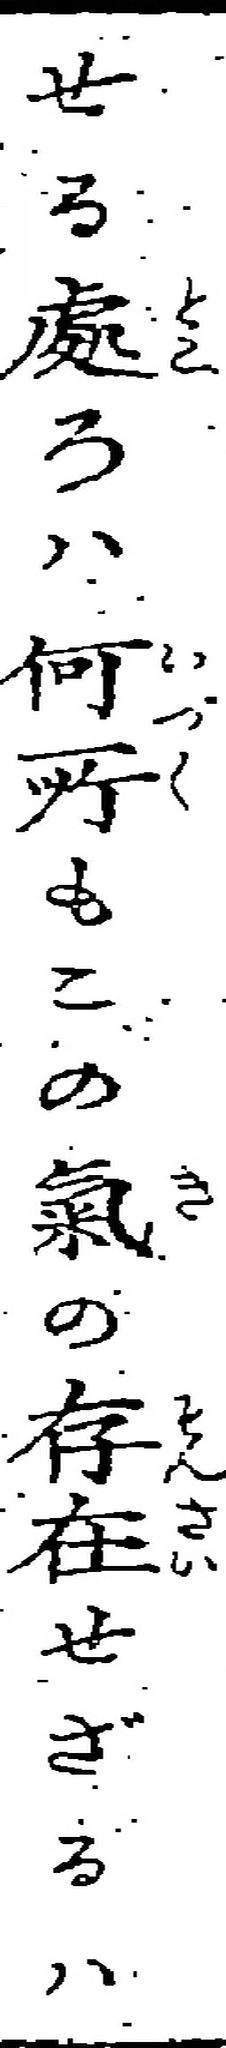せる処ろハ何所もこの気のそ存在せざるは
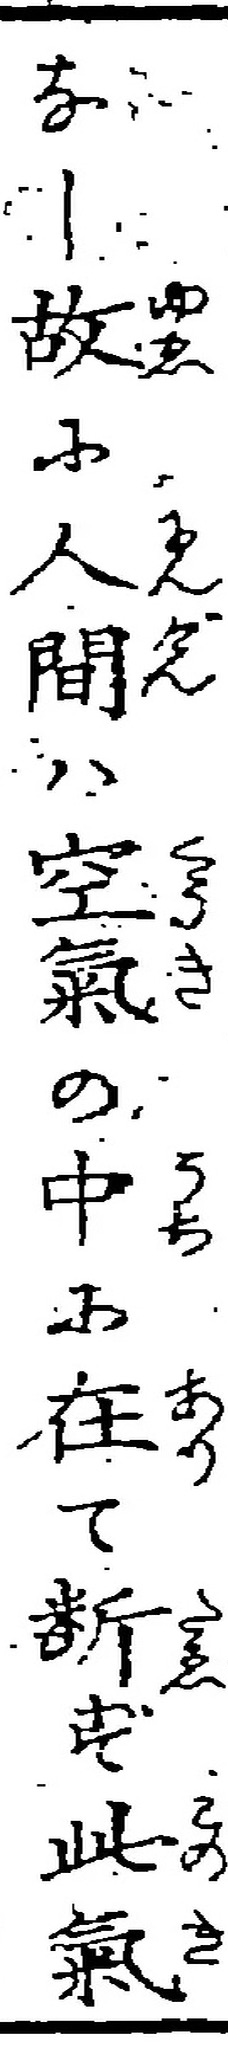なし故に人間は空気の中に在て断ず此気
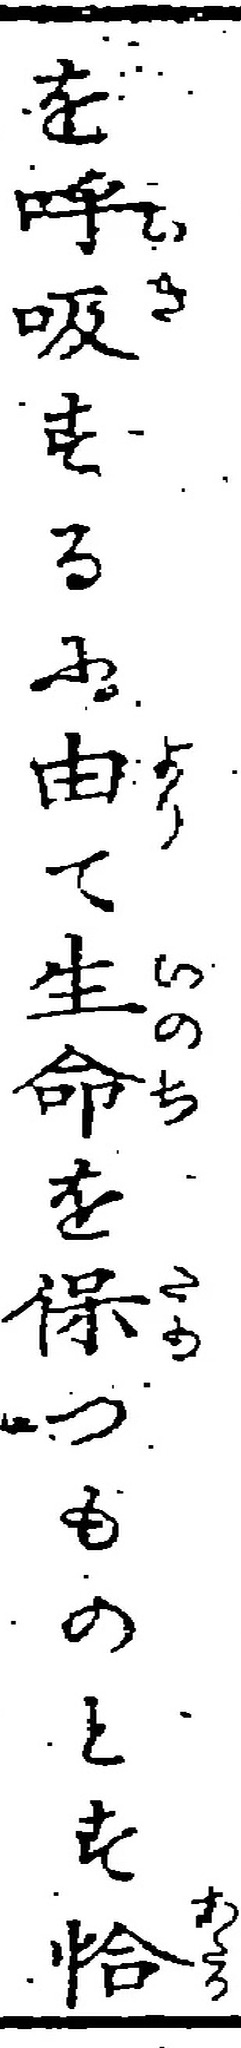を呼吸するに由て生命を保つものとす恰
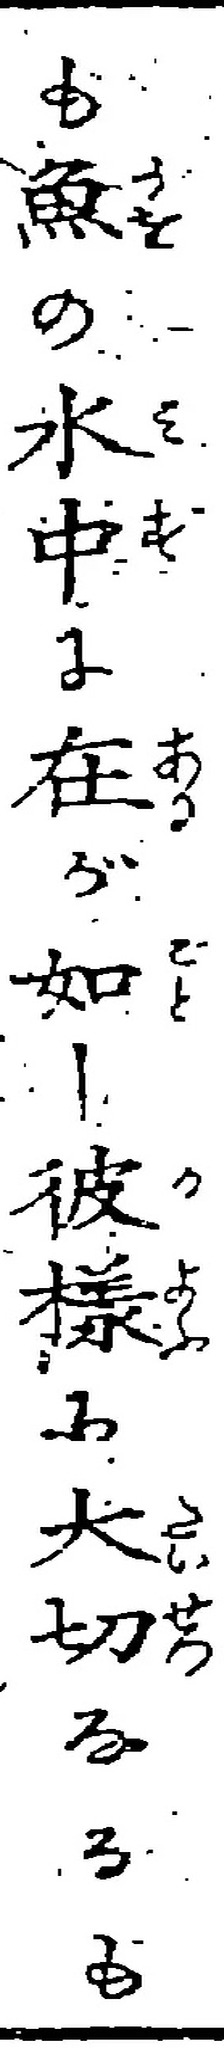も魚の水中に在が如し彼様に大切なるも

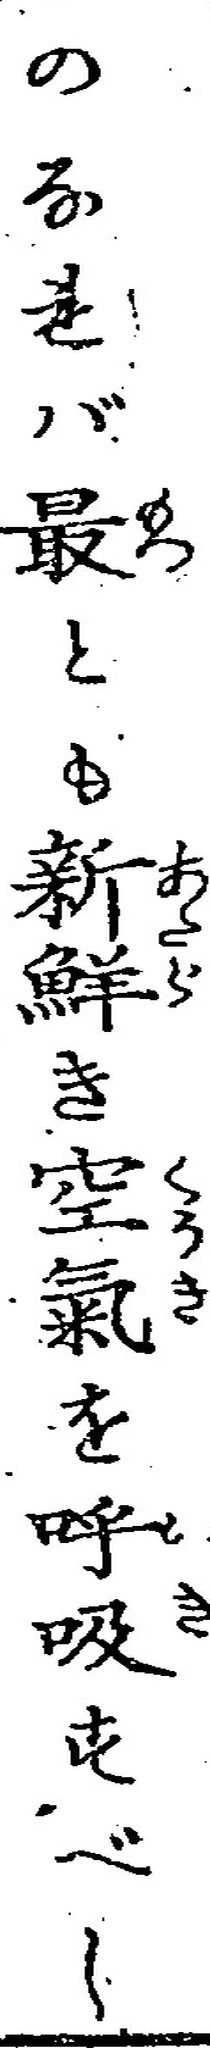のなれば最とも新鮮き空気を呼吸すべし
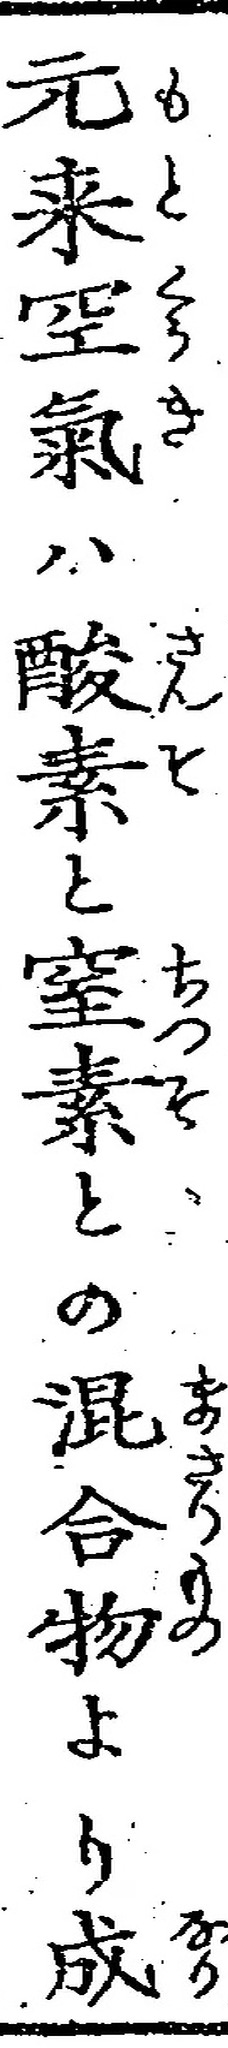元来空気は酸素と窒素との混合物より成
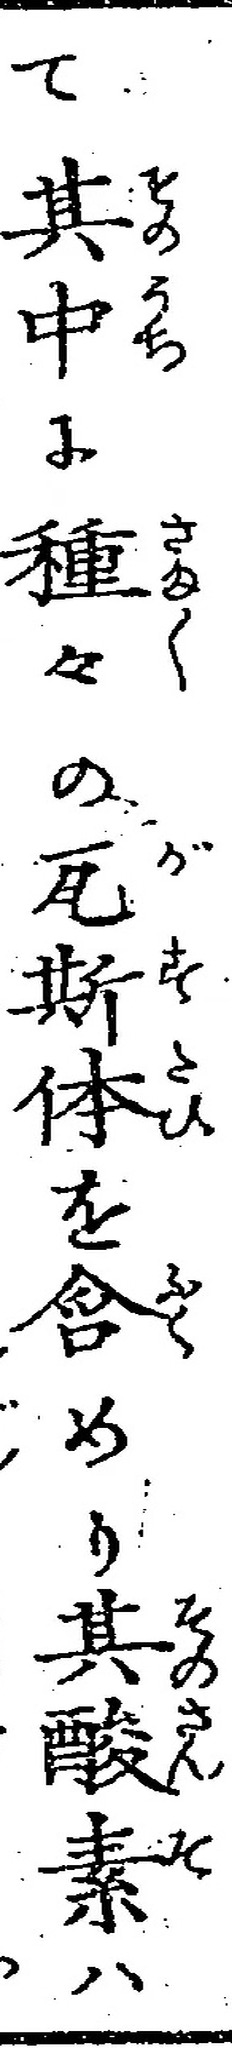て其中に種々の瓦斯体を含めり其酸素は
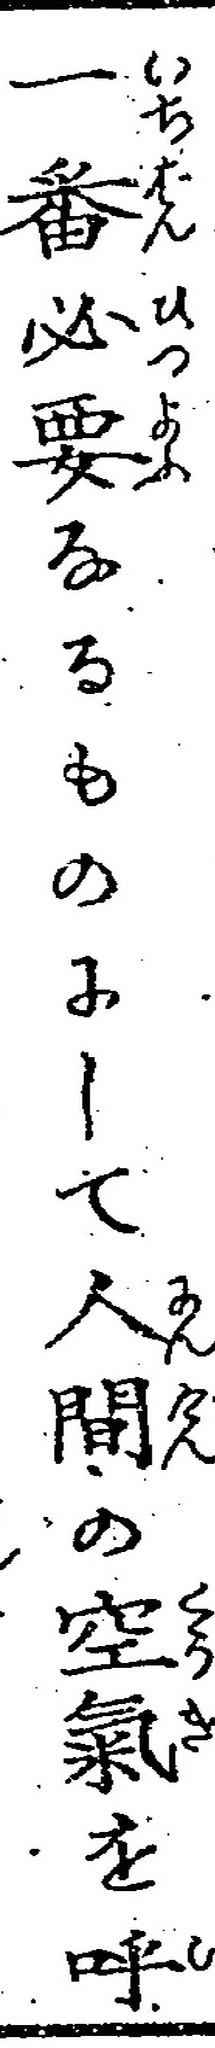一番必要なるものにして人間の空気を呼
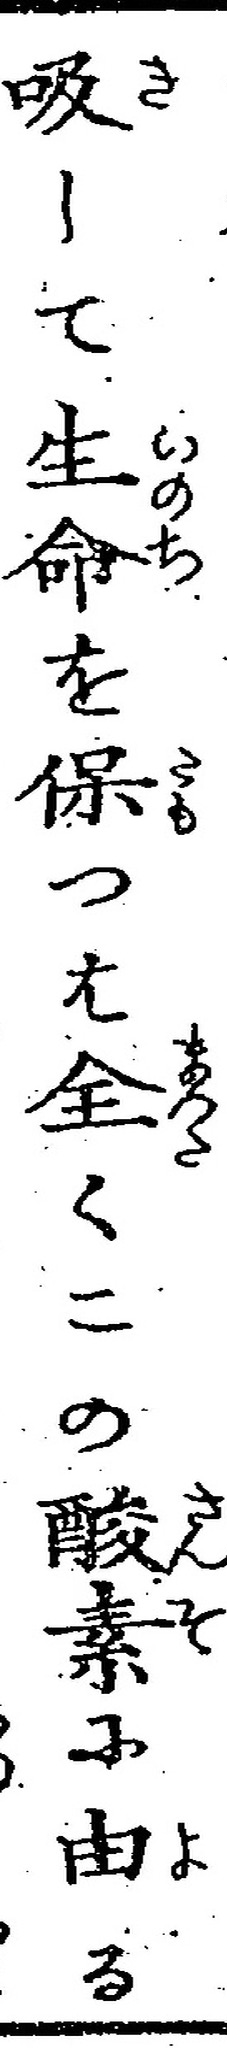吸して生命を保つは全くこの酸素に由る
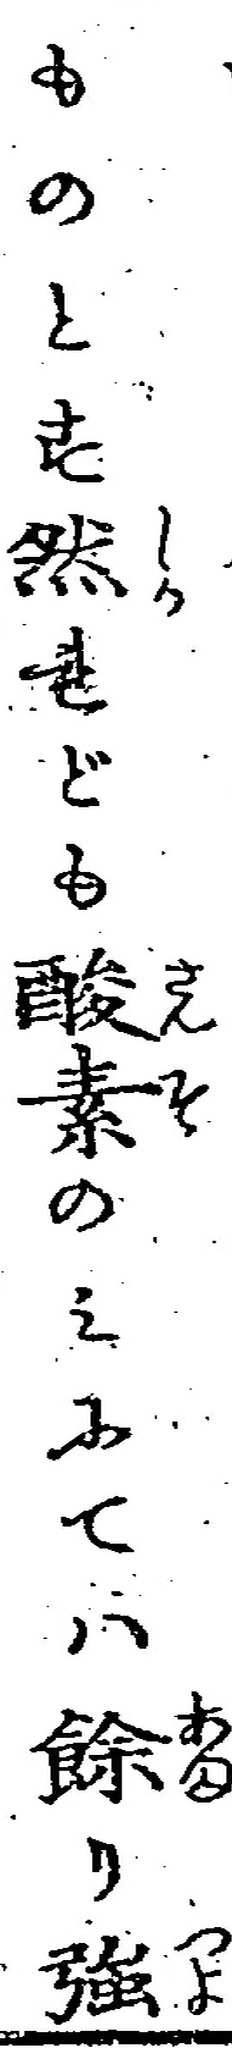ものとす然れども酸素のみにては余り強
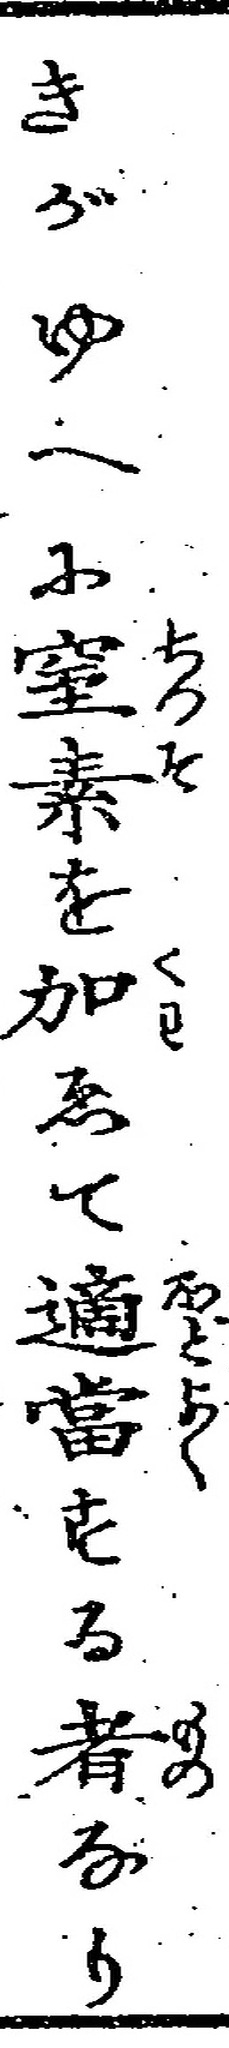きがゆへに窒素を加ゑて適当する者なり
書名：コレラ予防命乃後見
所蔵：国立国会図書館 National Diet Library, JAPAN
